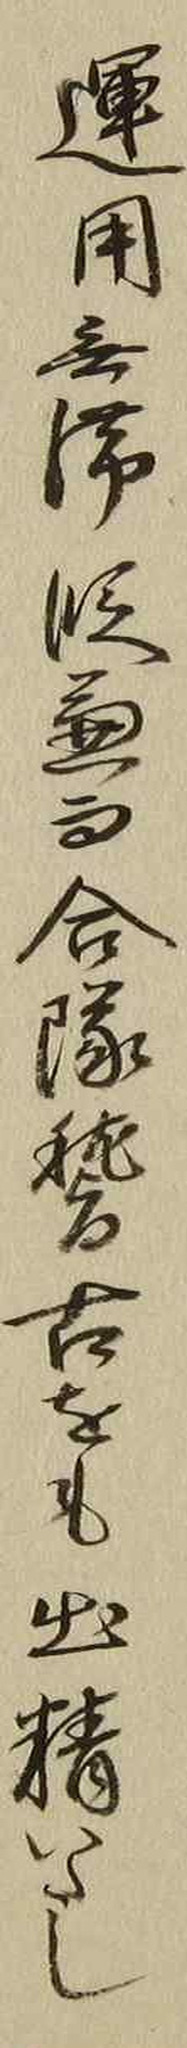運用無滞段兼而合隊稽古をも出精いたし
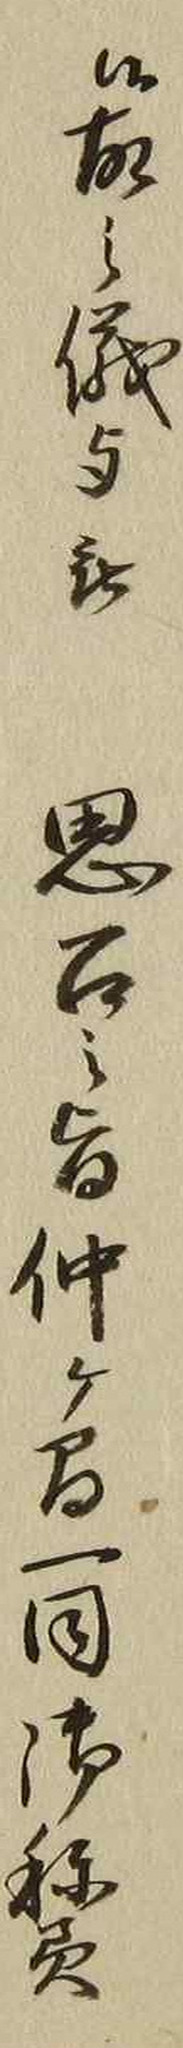候故之儀与被思召之旨仲ヶ間一同御称美
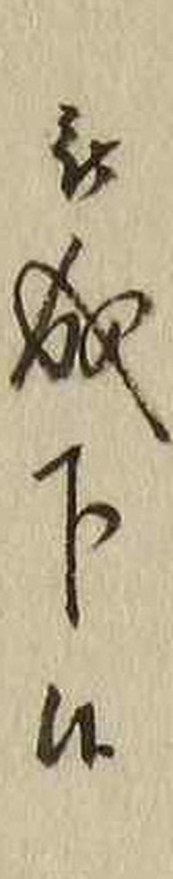被成下候
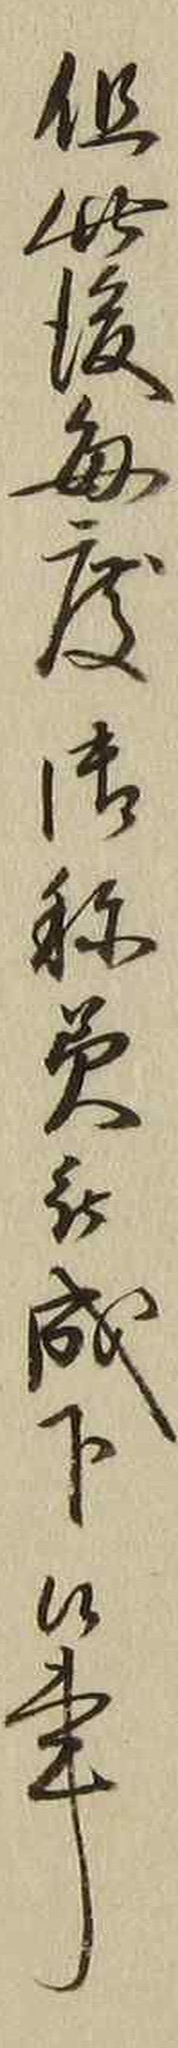但此後毎度御称美被成下候事
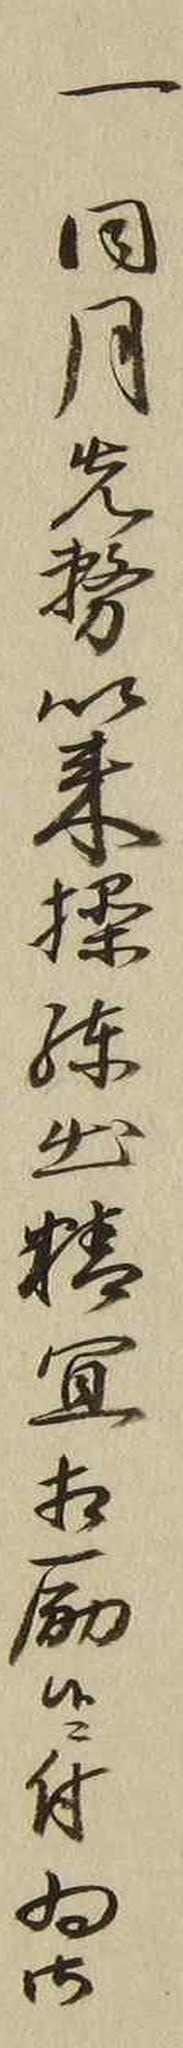一同月先務以来操練出精宜相励候ニ付為御
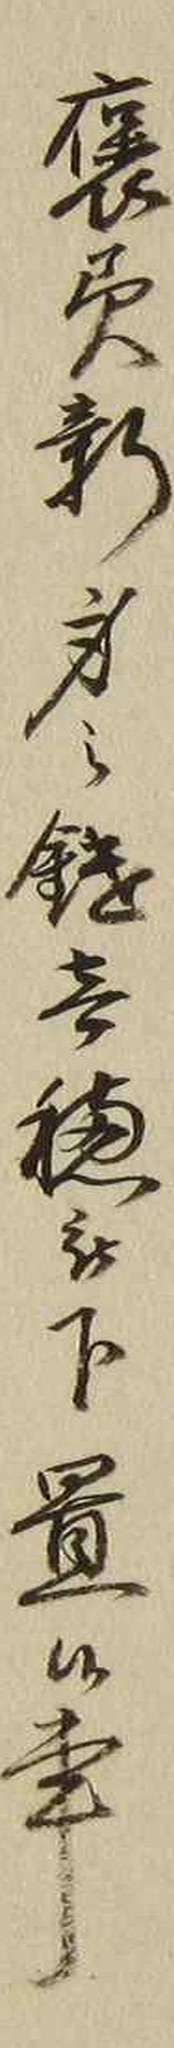褒美新身之鑓壱穂被下置候事
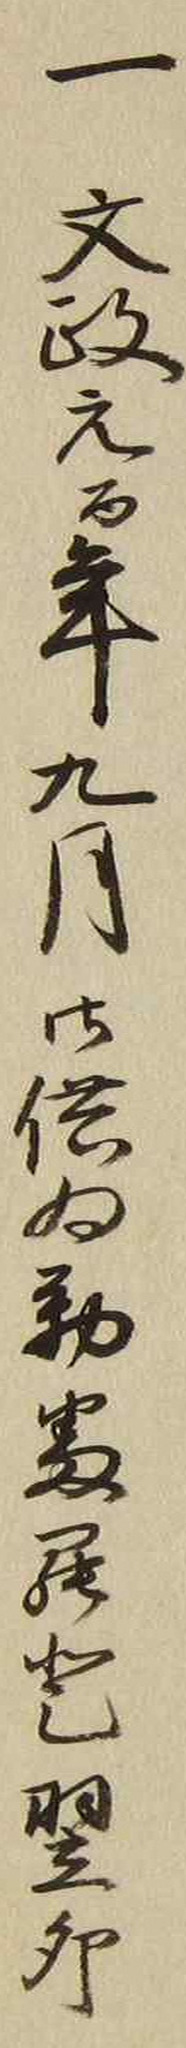一文政元酉年九月御供為勤番罷登翌卯
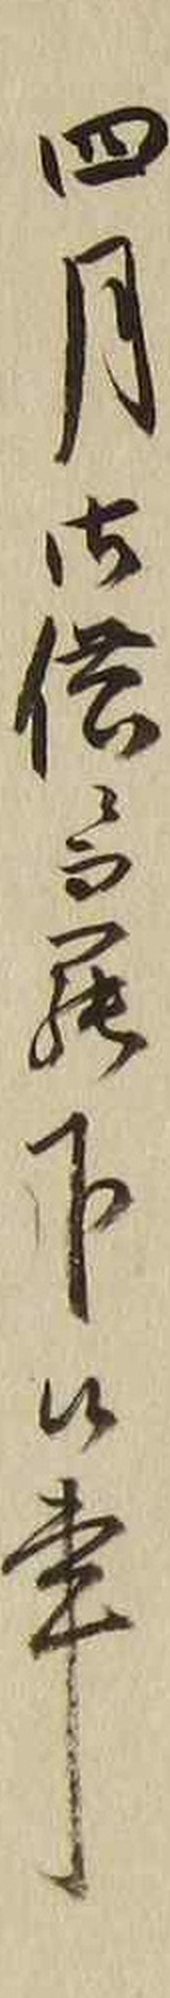四月御供ニ而罷下候事
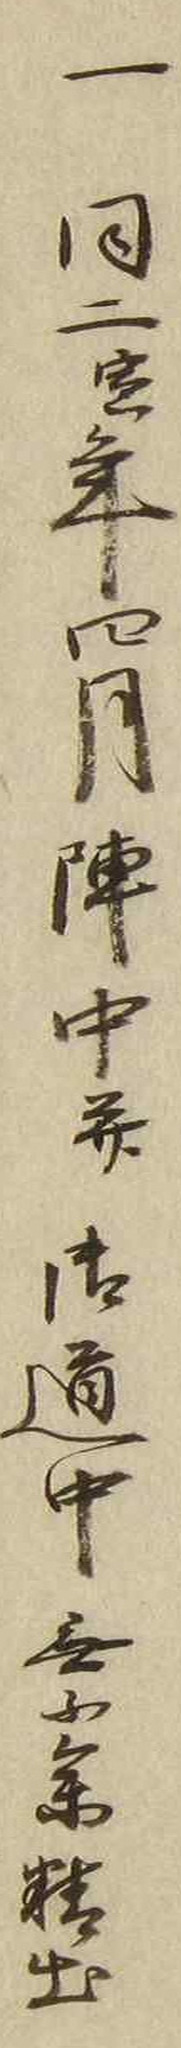一同二寅年四月陣中幷御道中無不参精出

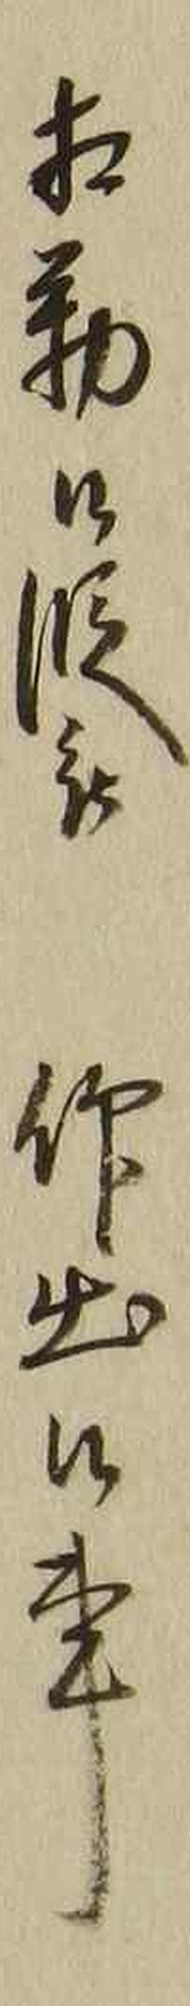相勤候段被仰出候事
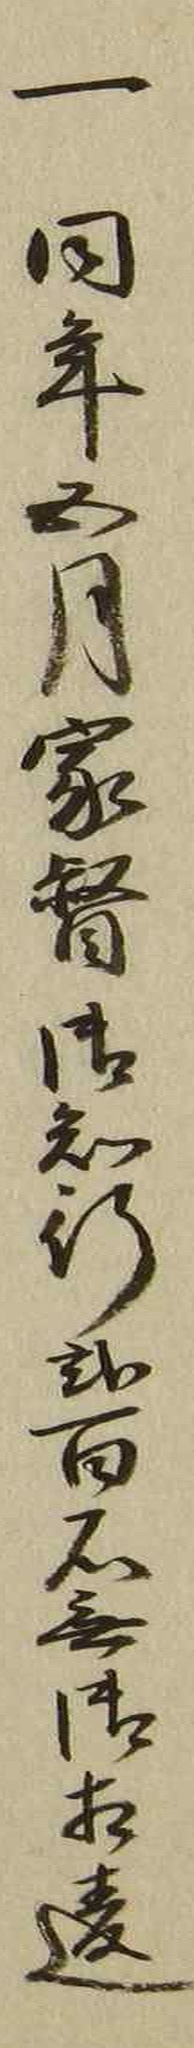一同年五月家督御知行弐百石無御相違
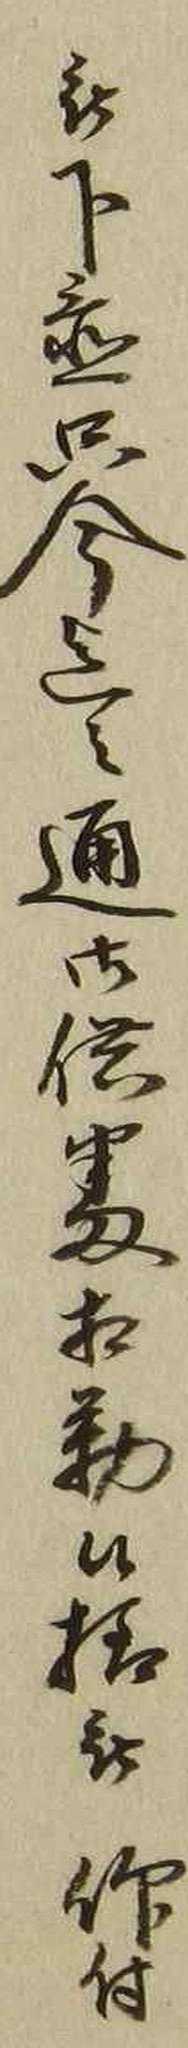被下置只今迄之通御供番相勤候様被仰付
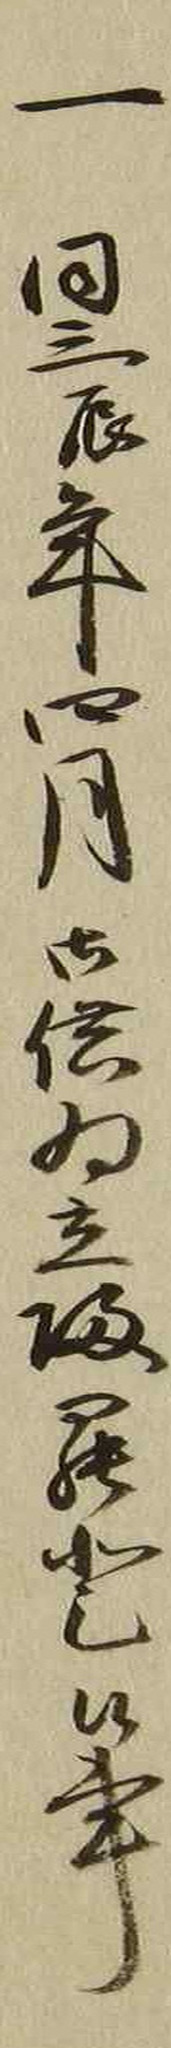一同三辰年四月御供為立帰罷登候事
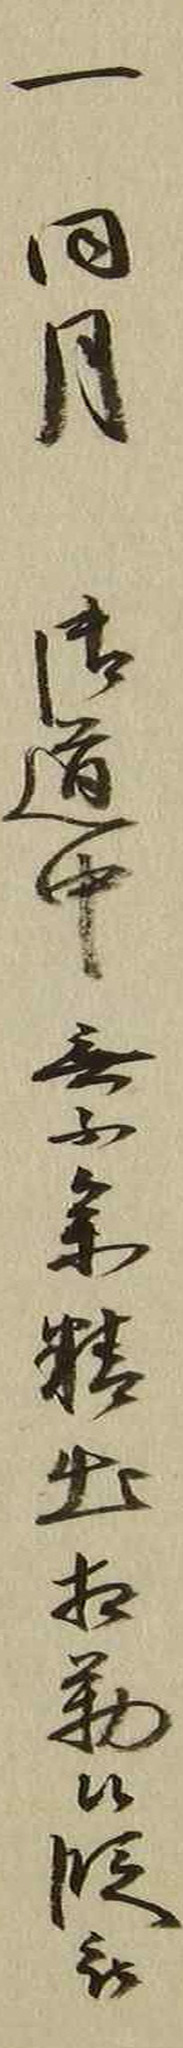一同月御道中無不参精出相勤候段被
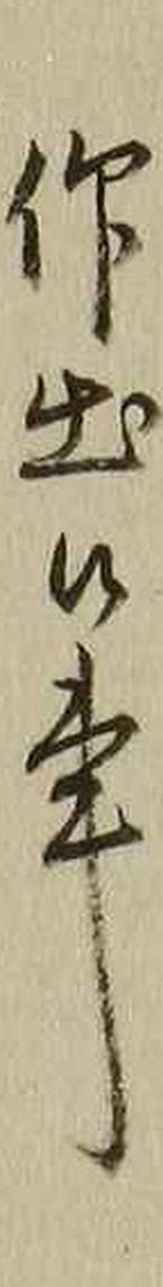仰出候事
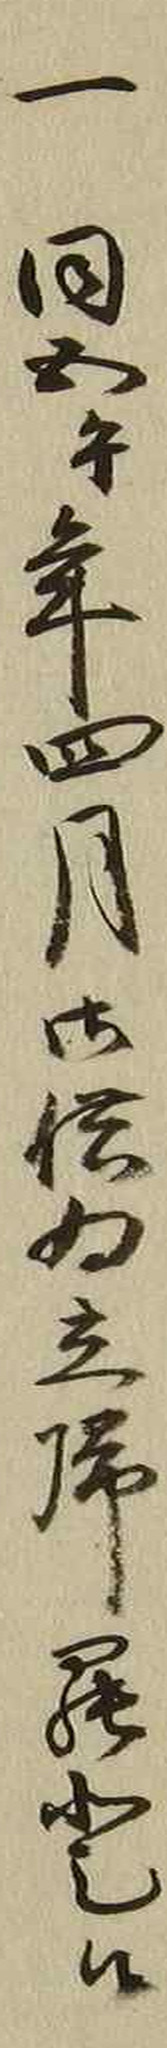一同五午年四月御供為立帰罷登候
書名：諸士系譜　巻之128　た之部4
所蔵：会津若松市立会津図書館
